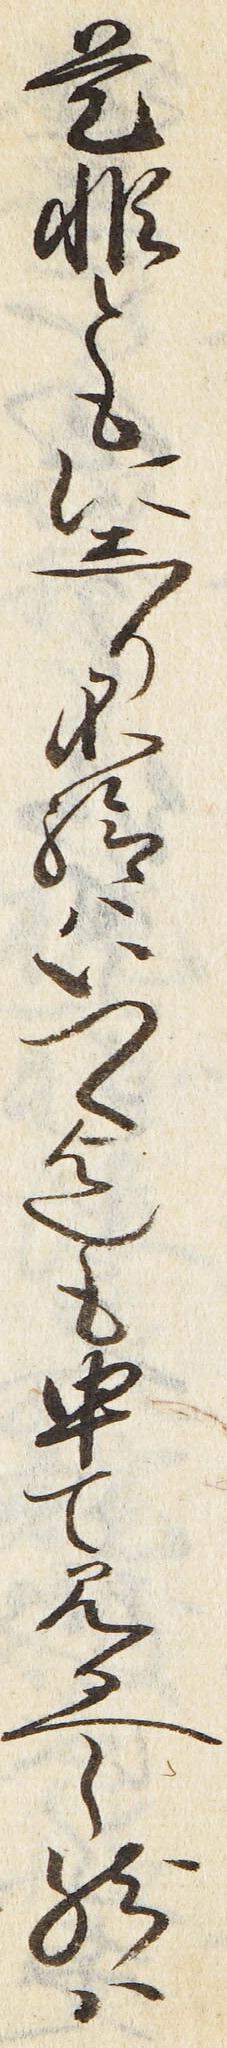是非ともにしり不給はいつく迄も申て見るへし然は
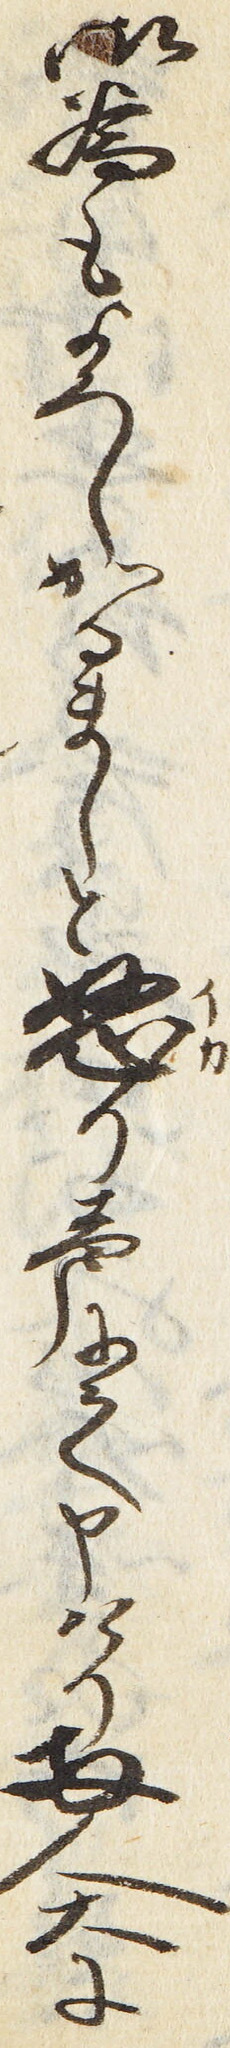御為もよろしかるましと怒り声にて申けり両人大に
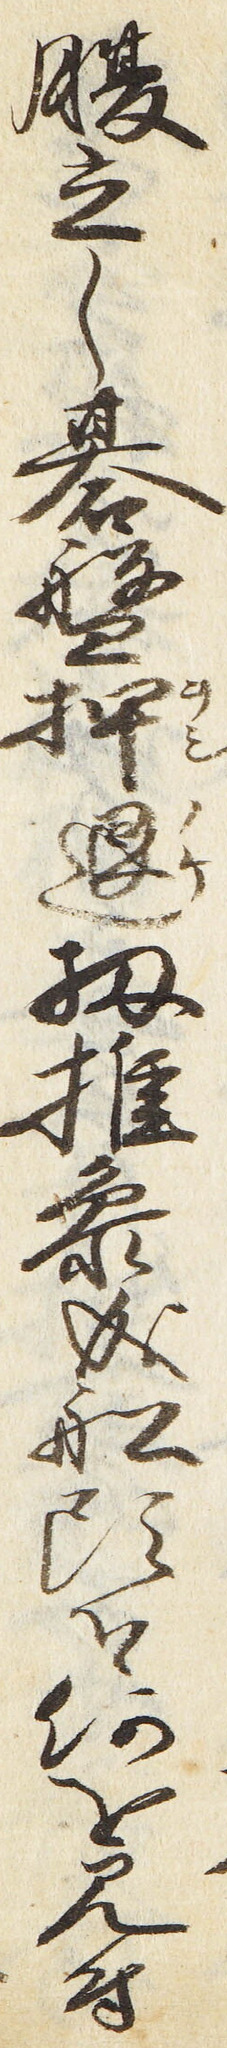腹立し碁盤押退扨推参成船頭そ何を見付
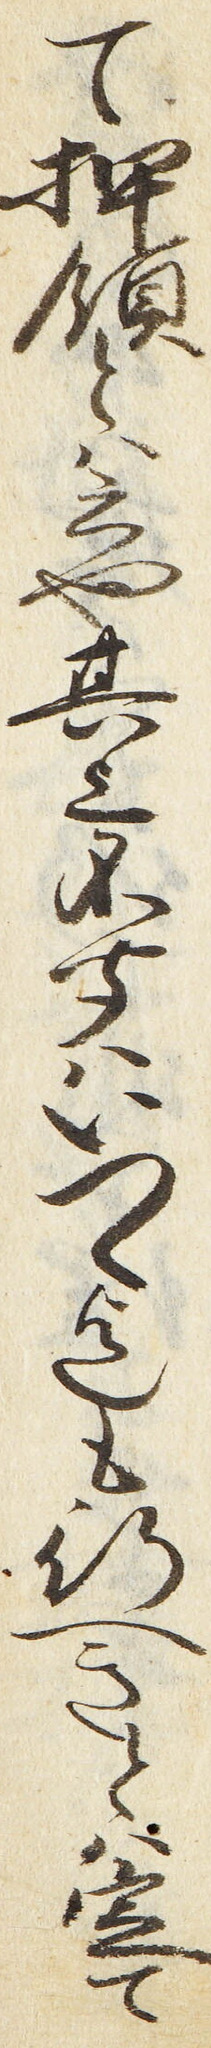て横領とは也其上不聞はいつく迄も行へきとは定て

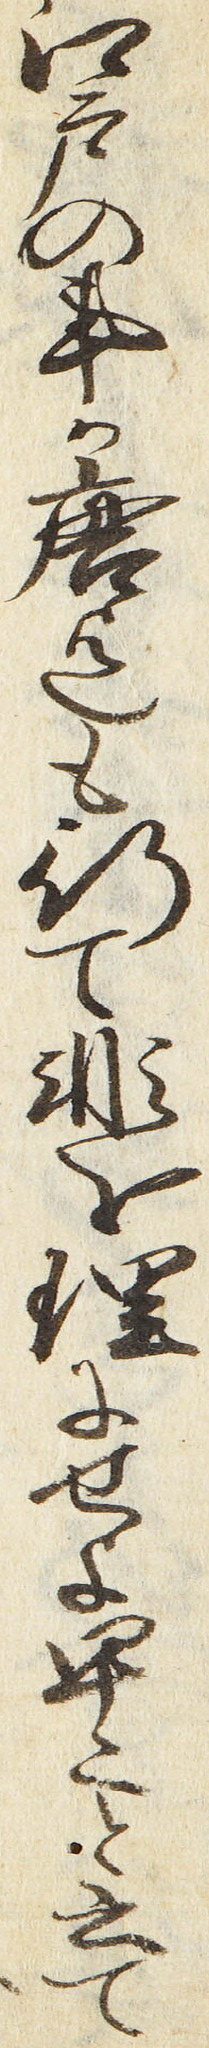江戸の事か唐迄も行て非を理にせよ早々と云て
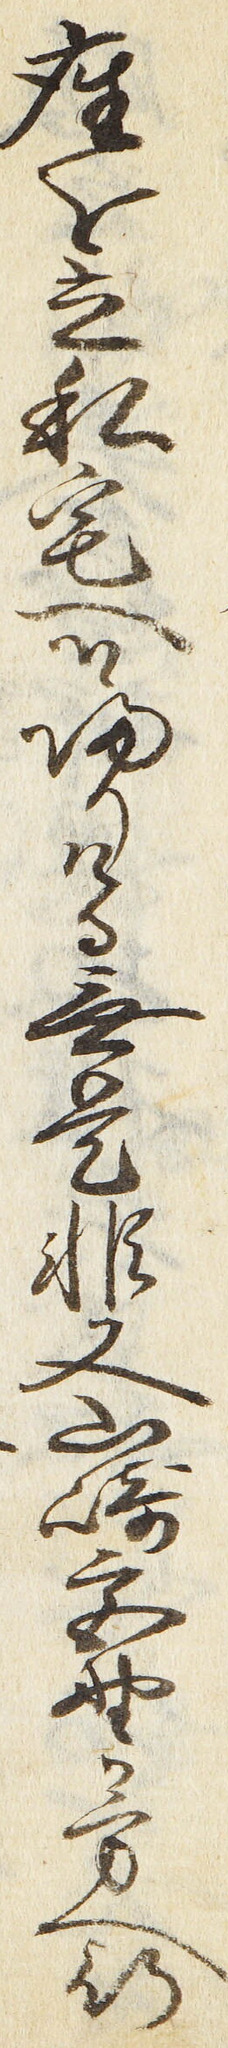座を立私宅へそ帰りける無是非又山崎宮野か方へ行
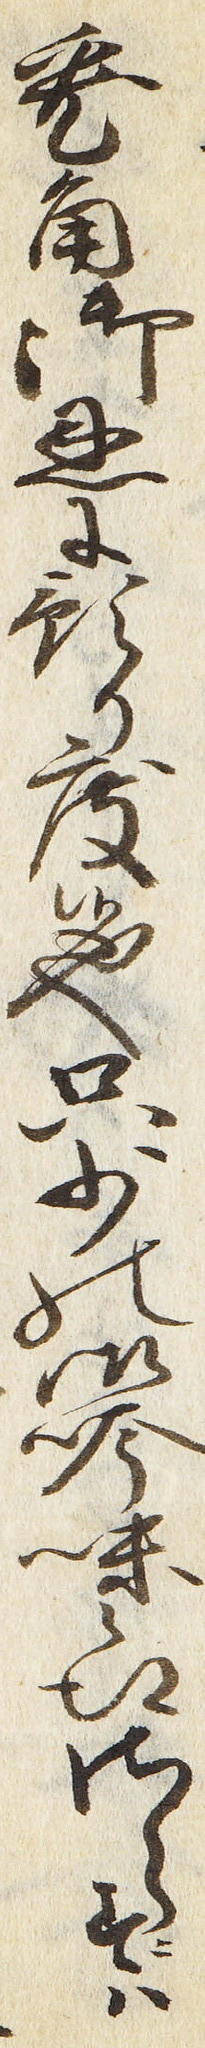兎角御恩に預り度候也只少の御吟味候得さらずは
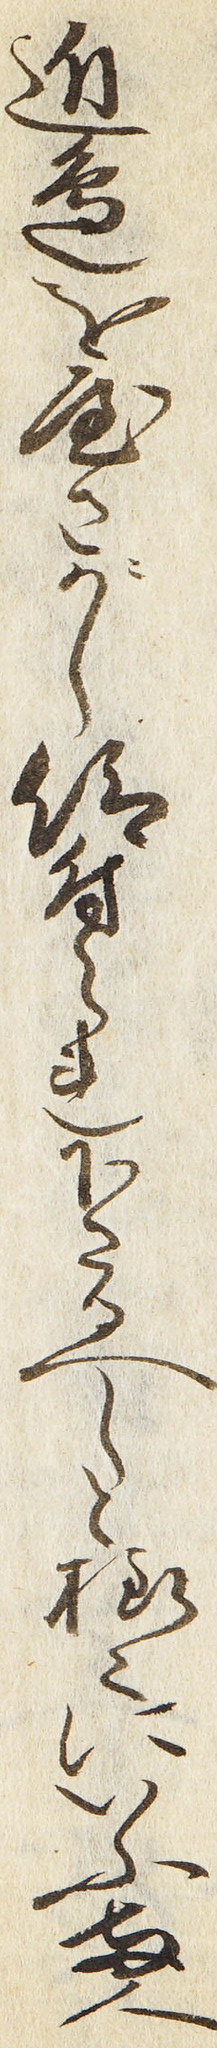近辺をやさがし仰付られ下さるへしと様々にいふ両人
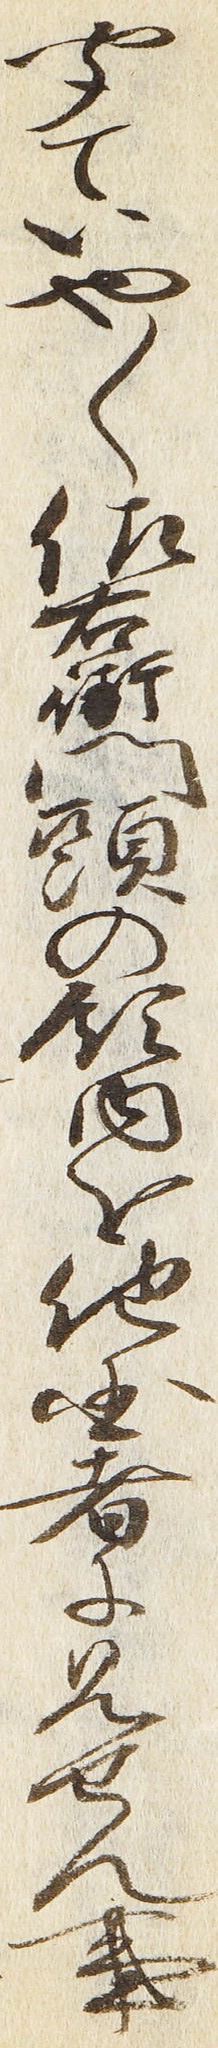聞ていや〳〵佐右衛門頭の領内を他国者に見せん事
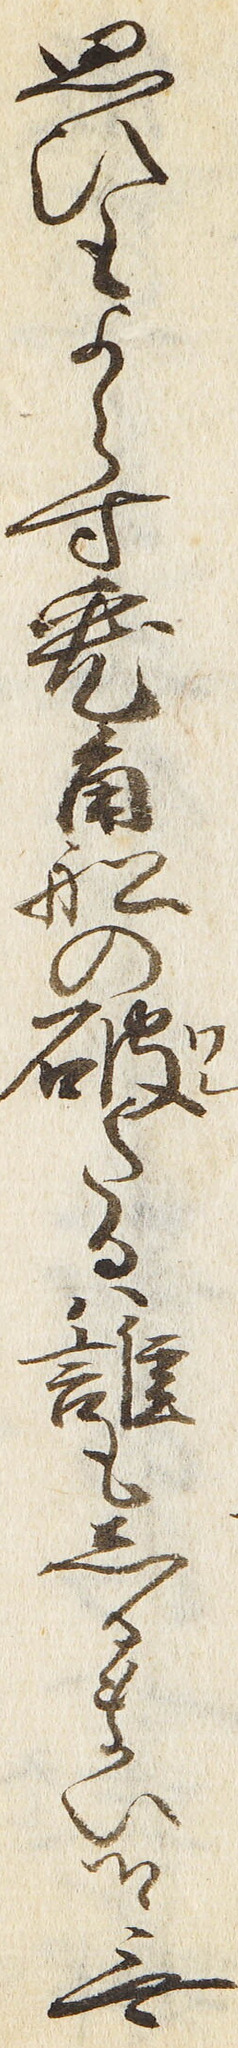思ひもよらす兎角船の破たるは誰もしるまいそ無
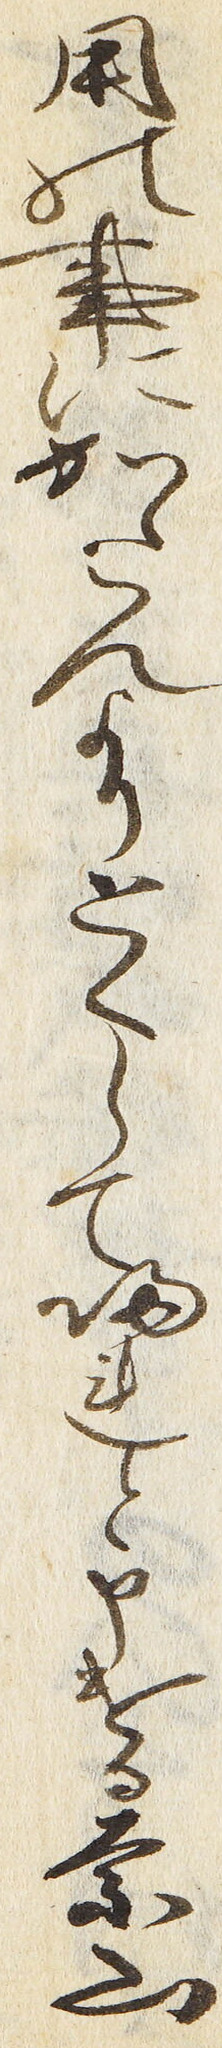用の事にかからんよりとくして帰れと申ける奈山
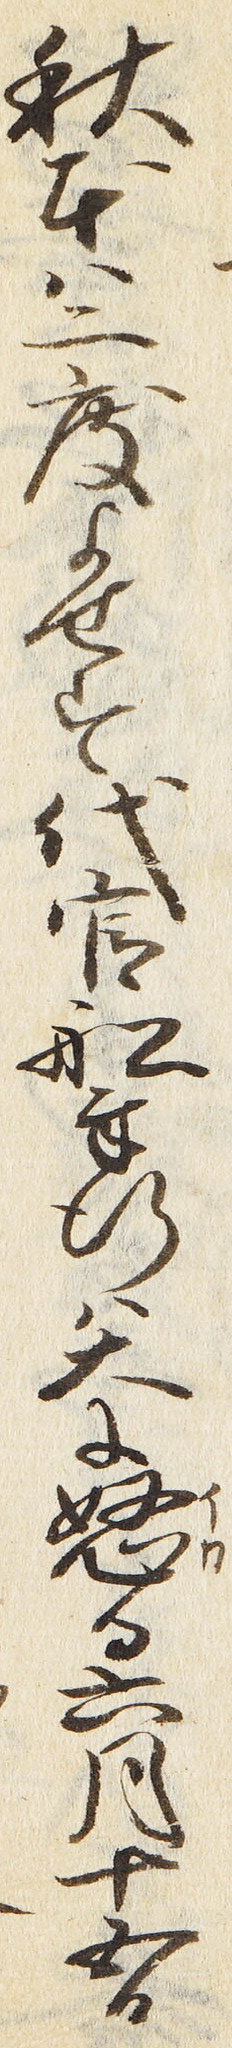秋本は二度よせす代官船奉行は大に怒る六月十五日
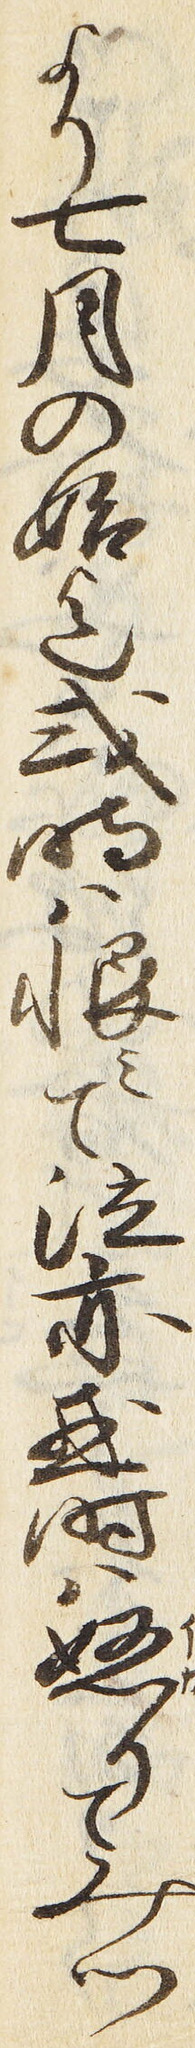より七月の始迄或時は恨みて泣亦或時は怒りてみつ
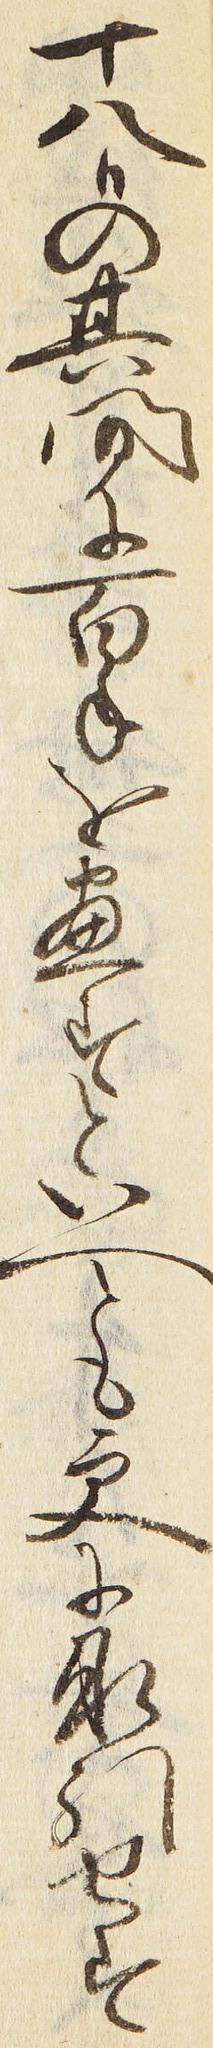十八日の其間に百手を尽すといへとも更に承引せす
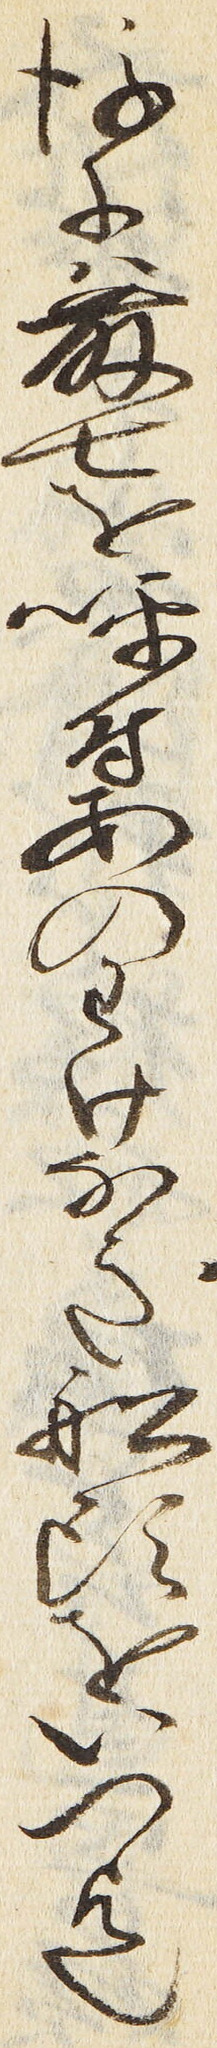後には藤七を呼付あのわけなき船頭をいつ迄
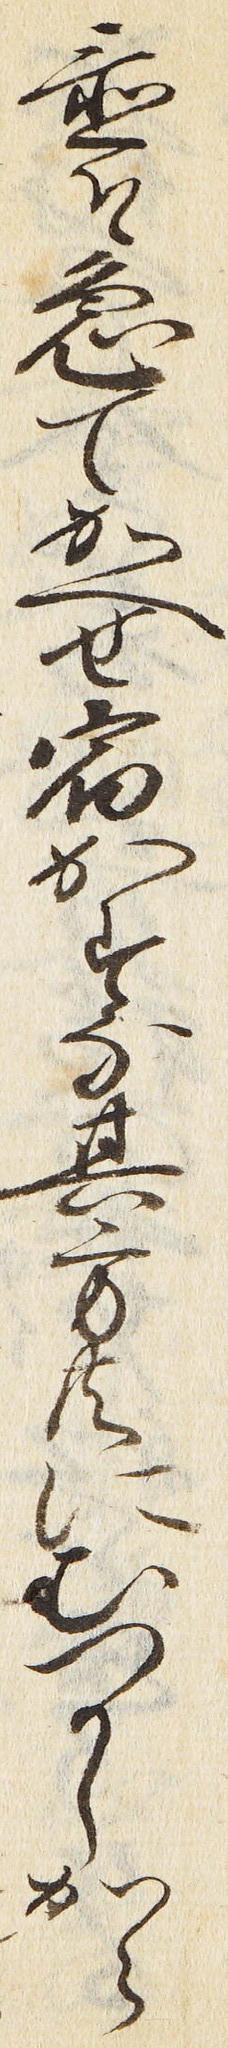置そ急てかへせ宿かすな其方共にむつかしから
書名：海陸世話日記
